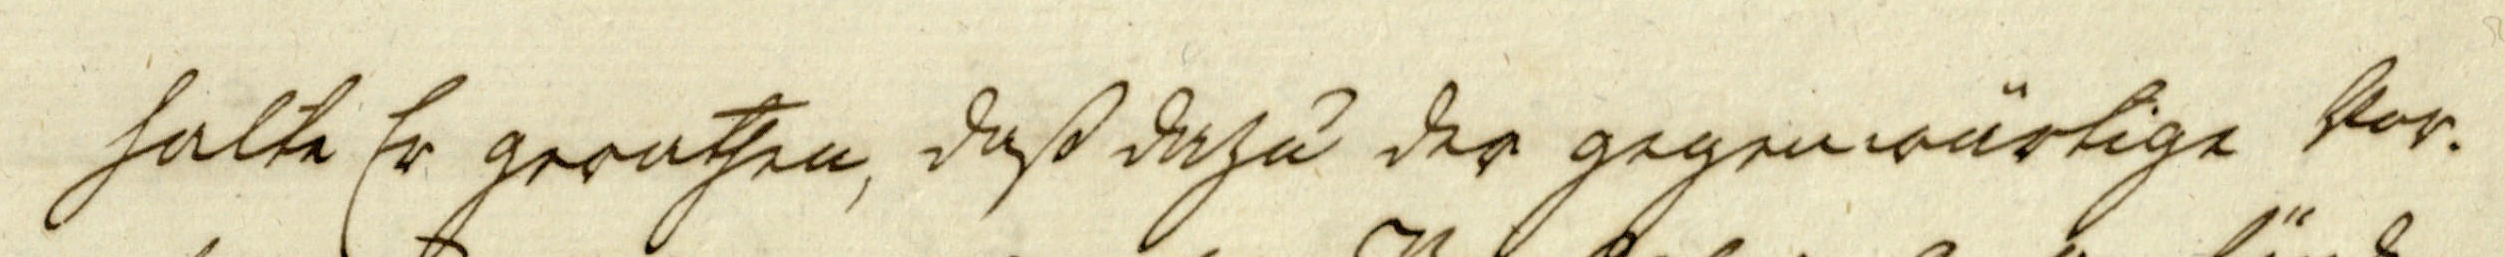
halte Er gerathen, daß dazu der gegenwärtige Vor¬
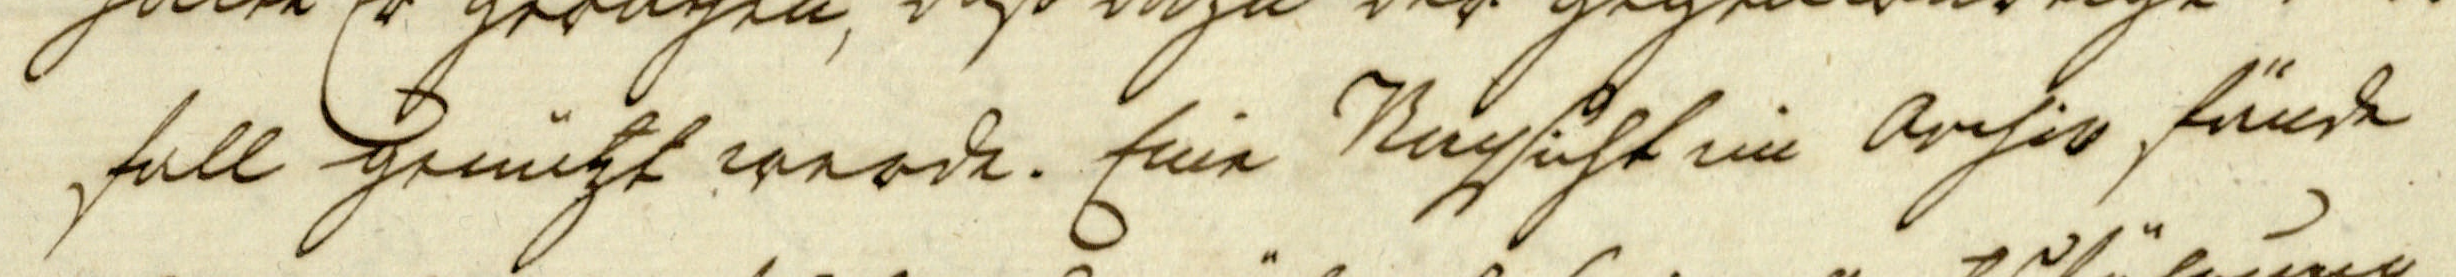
fall genützt werde. Eine Nachsicht im Archiv fände
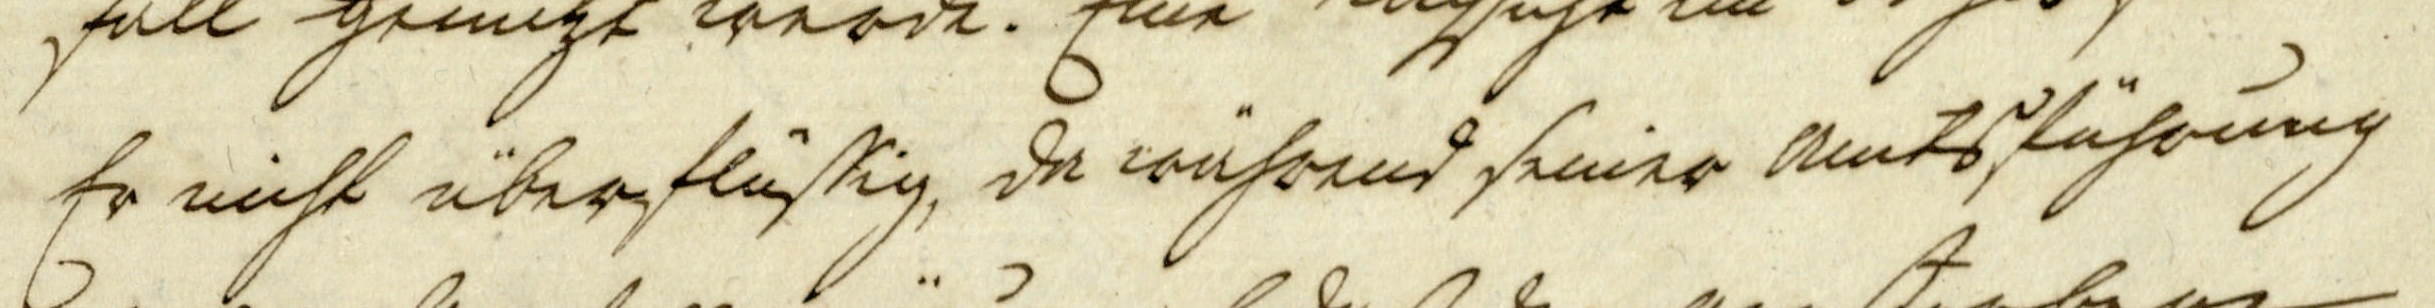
Er nicht überflüssig, da während seiner Amtsführung
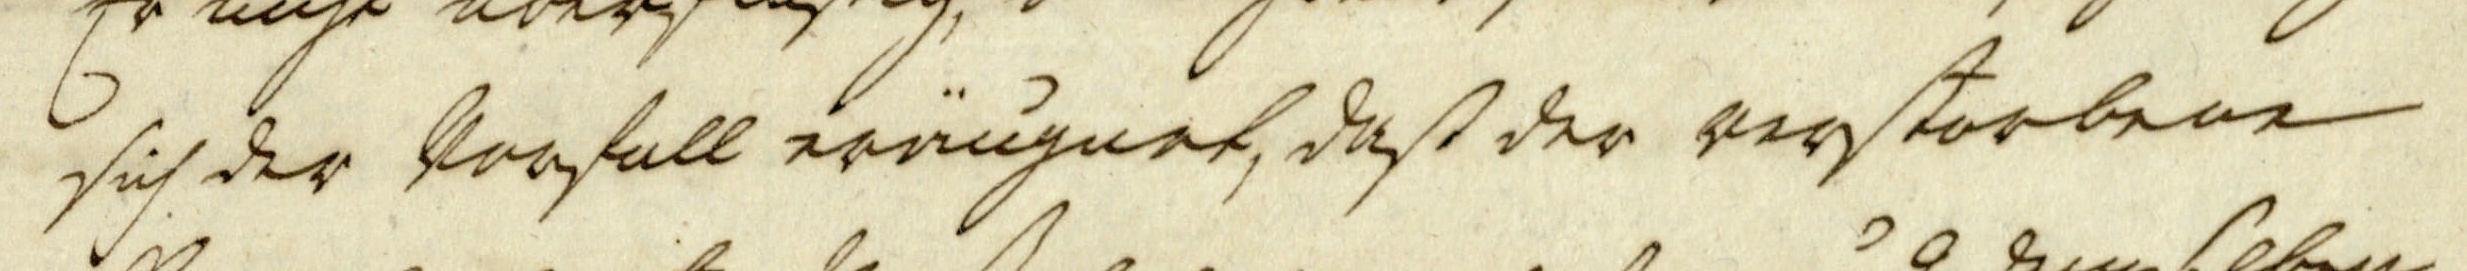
sich der Vorfall eräugnet, daß der verstorbene
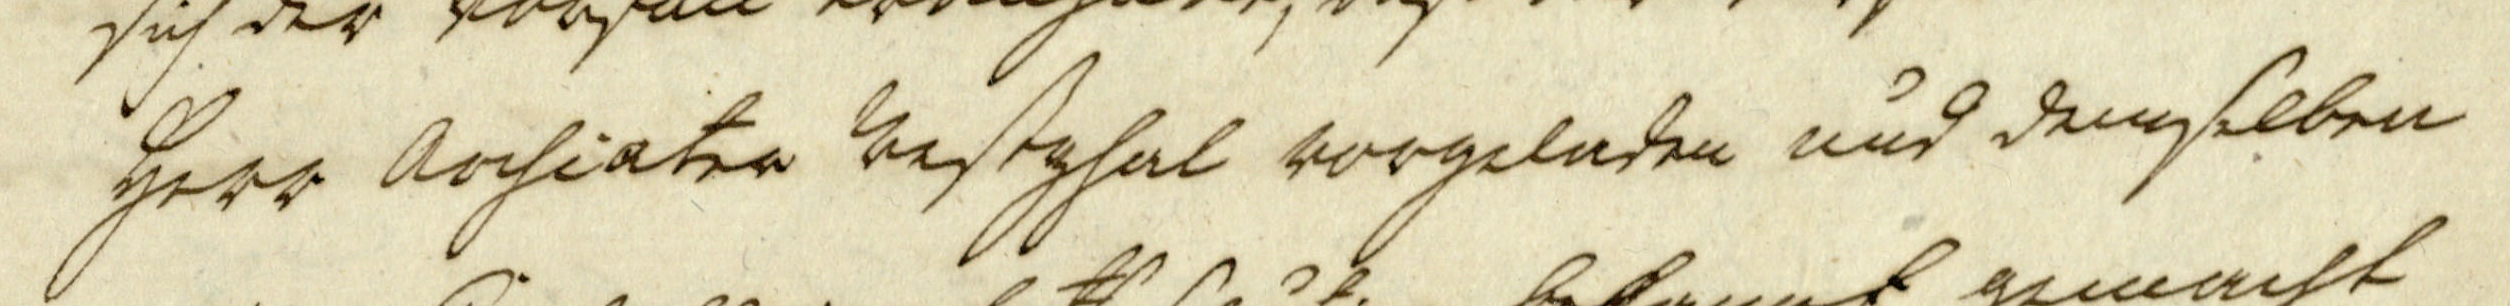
Herr Archiater Westphal vorgeladen und demselben
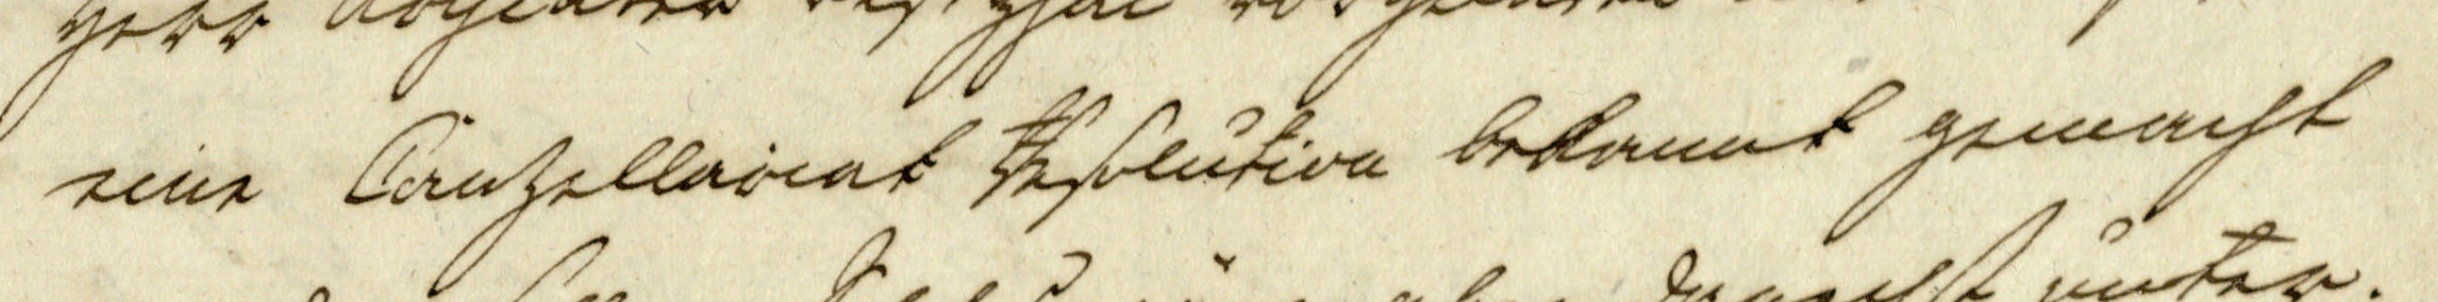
eine Canzellariat Resolution bekannt gemacht
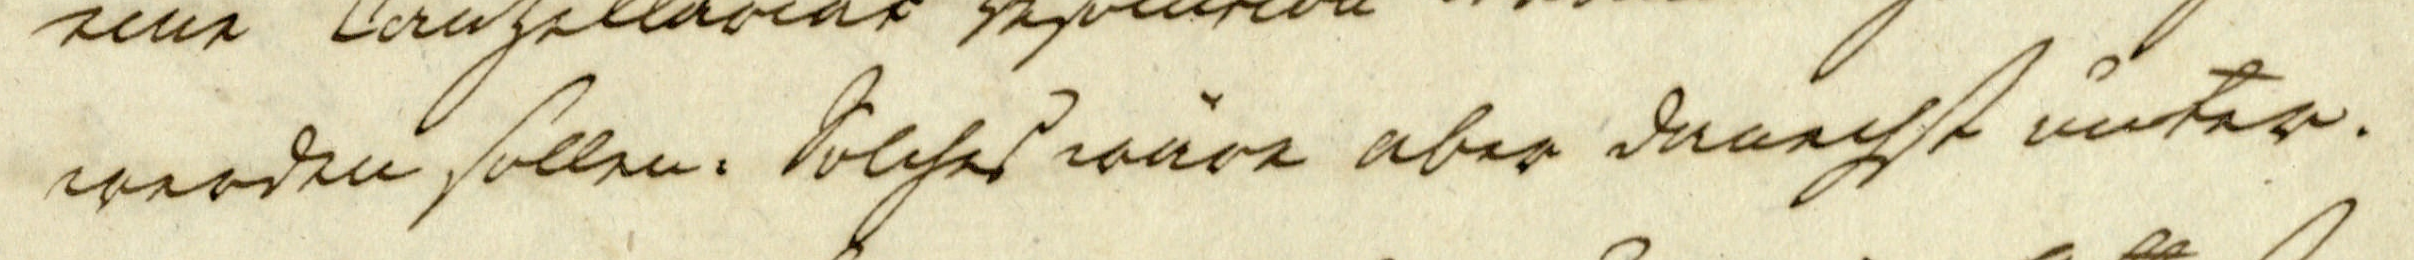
werden sollen. Solches wäre aber danechst unter¬
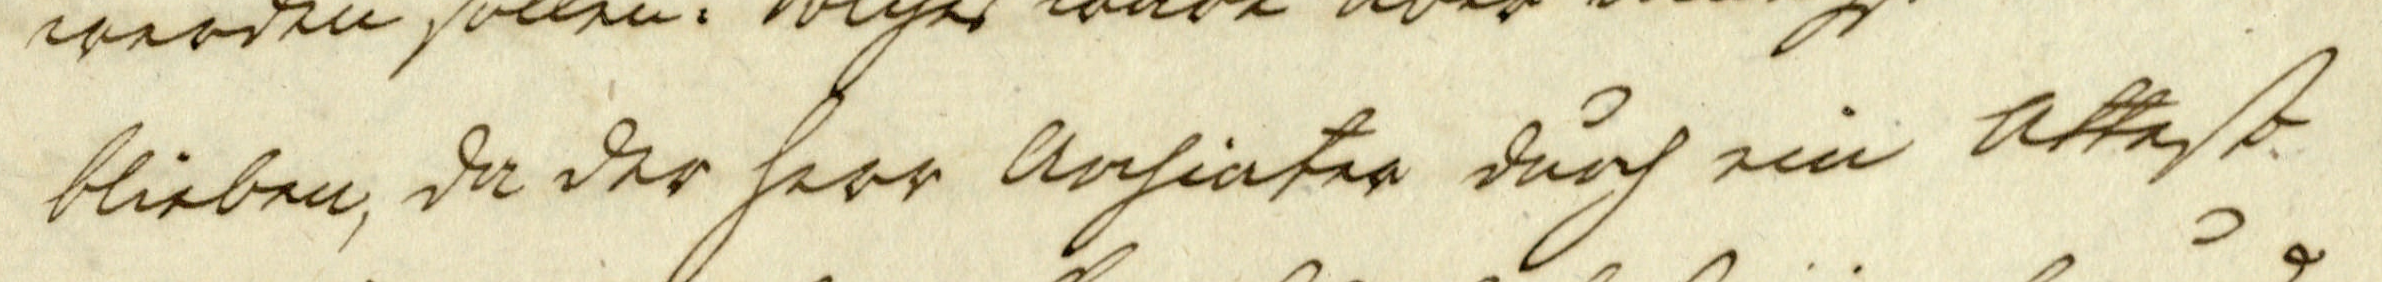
blieben, da der herr Archiater durch ein Attest
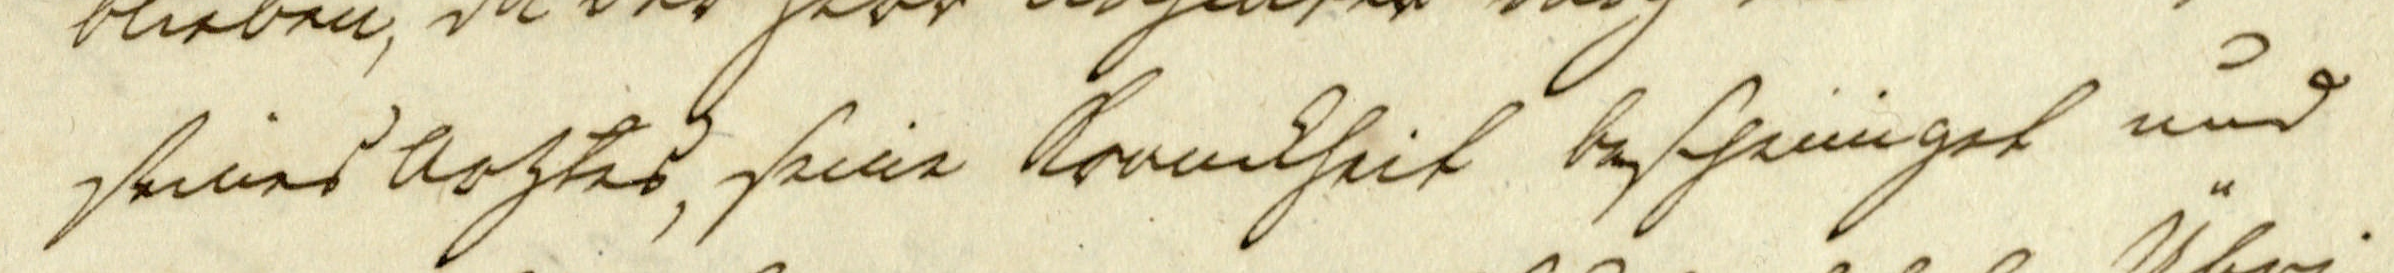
seines Arztes, seine Krankheit bescheiniget und
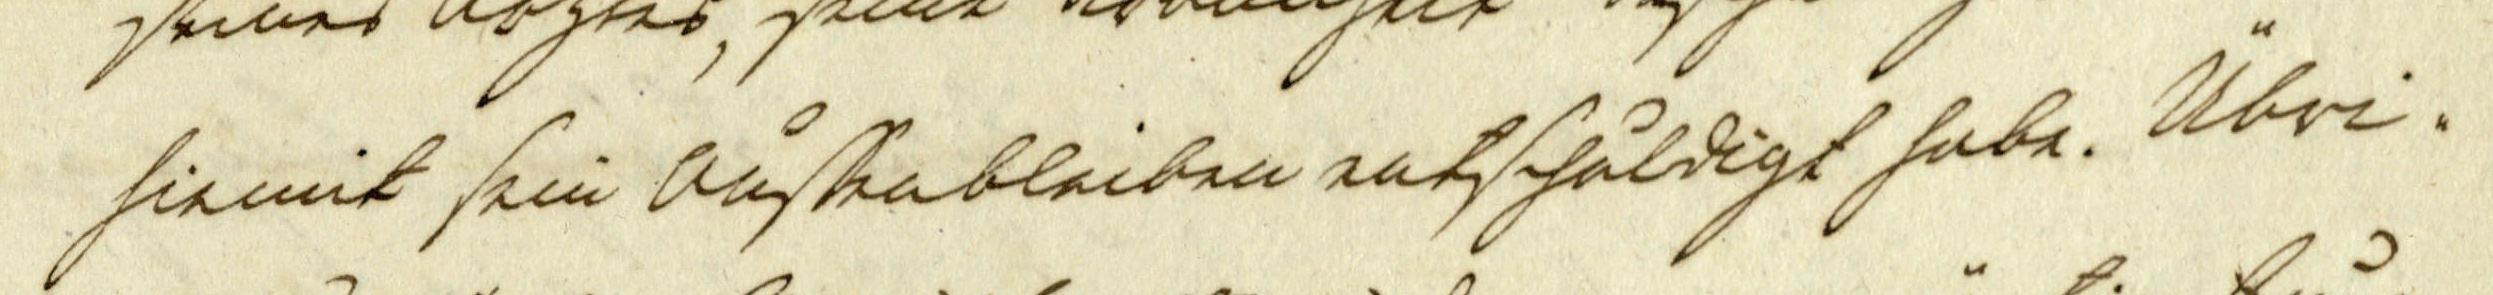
hiemit sein Aussenbleiben entschuldigt habe. Übri¬
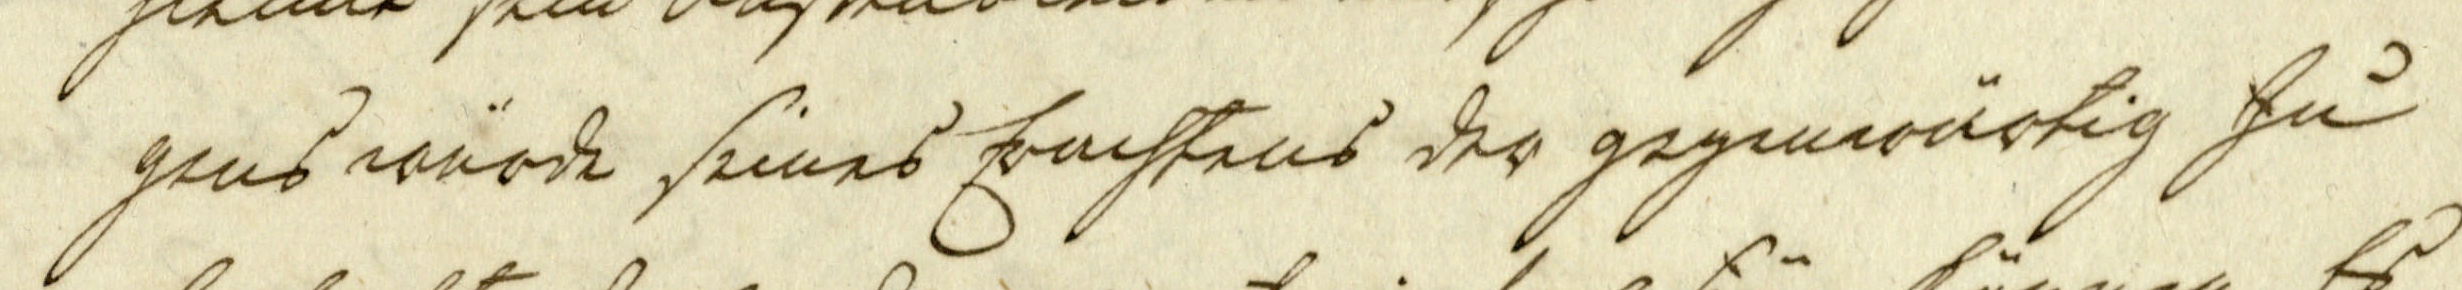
gens würde seines Erachtens der gegenwärtig zu
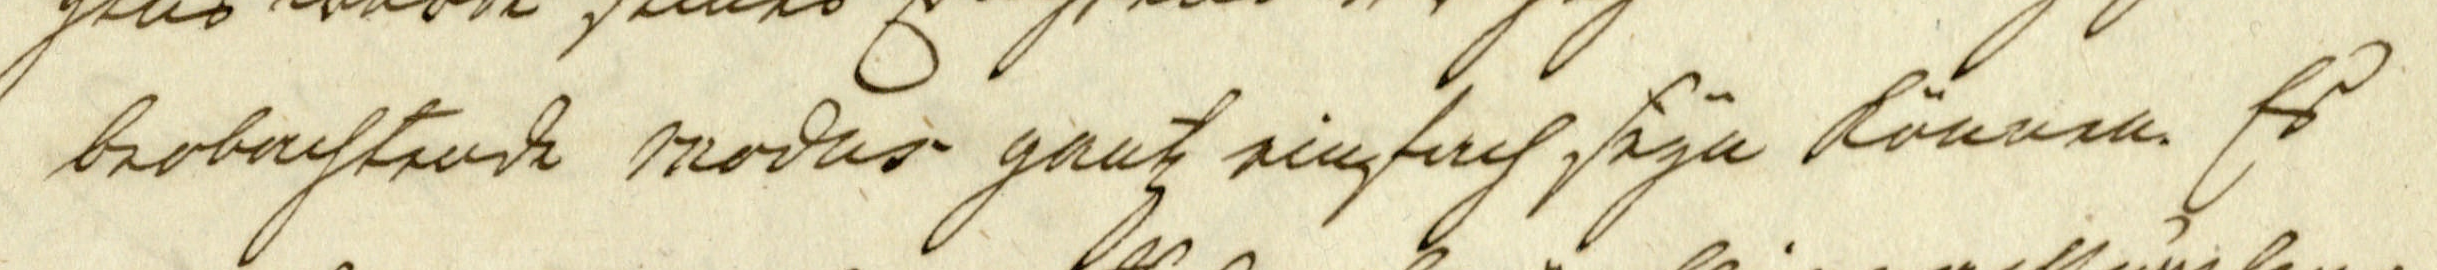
beobachtende Modus gantz einfach seÿn können. Es
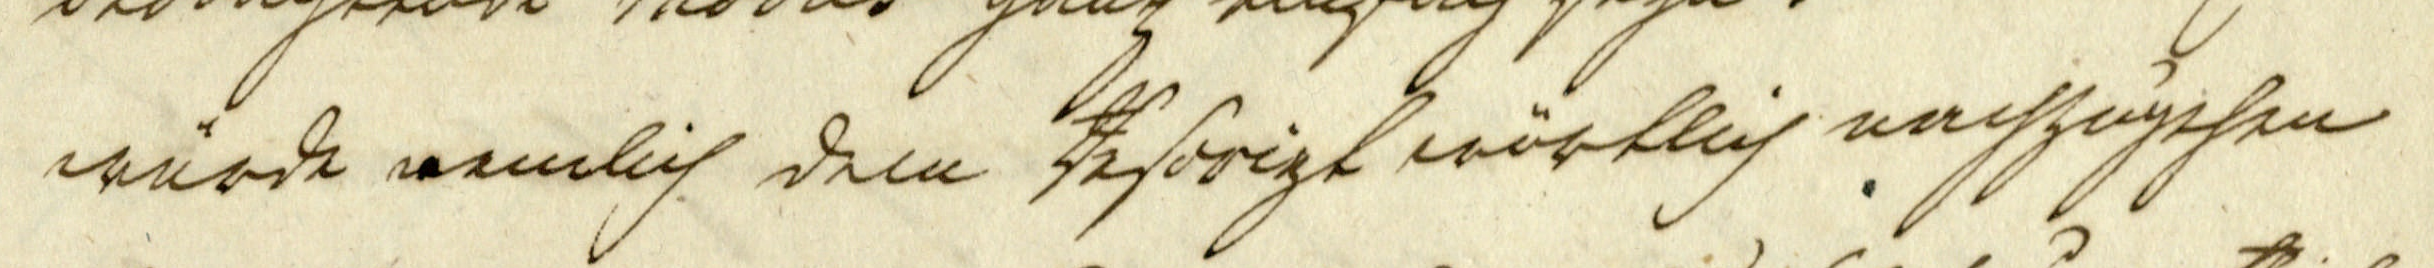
würde nemlich dem Rescript wörtlich nachzugehen
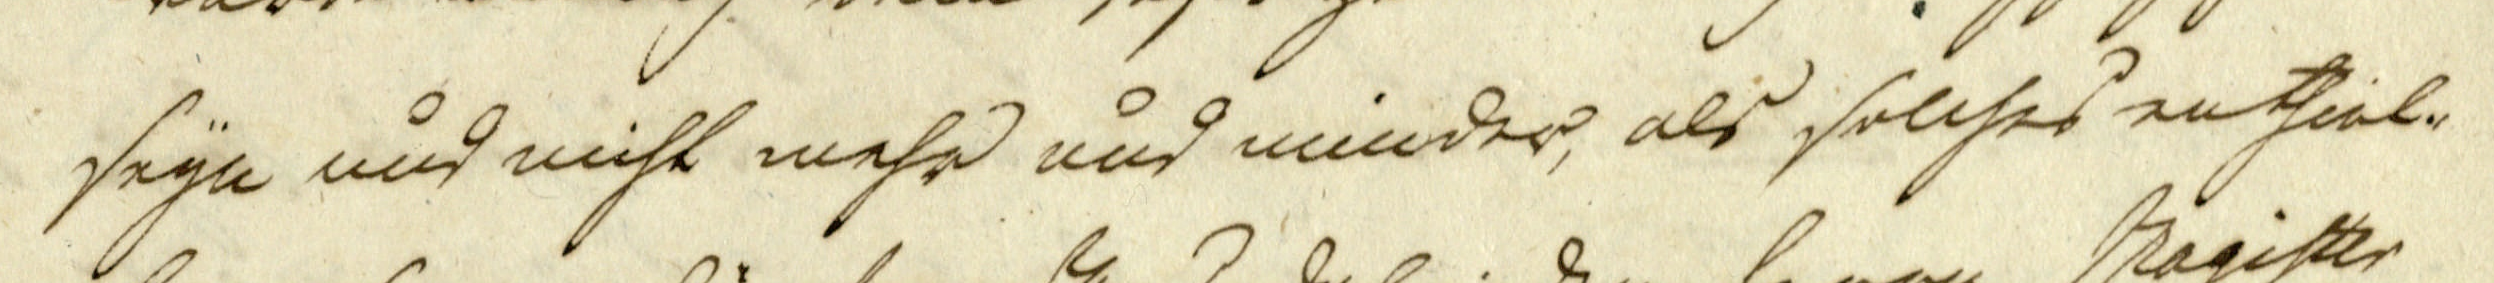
seÿn und nicht mehr und minder, als solches enthiel¬
